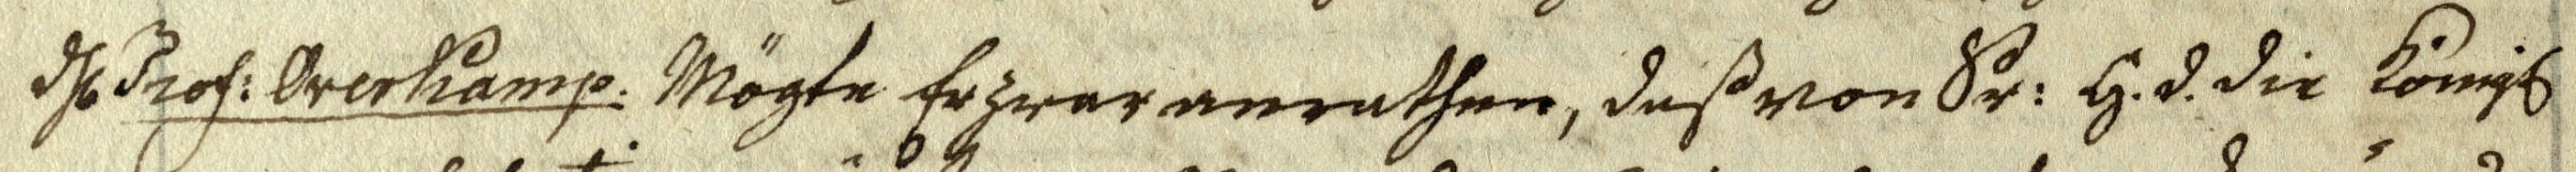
dh. Prof. Overkamp. Mögte Er zwar anrathen, daß von Sr H. d. die Königl.
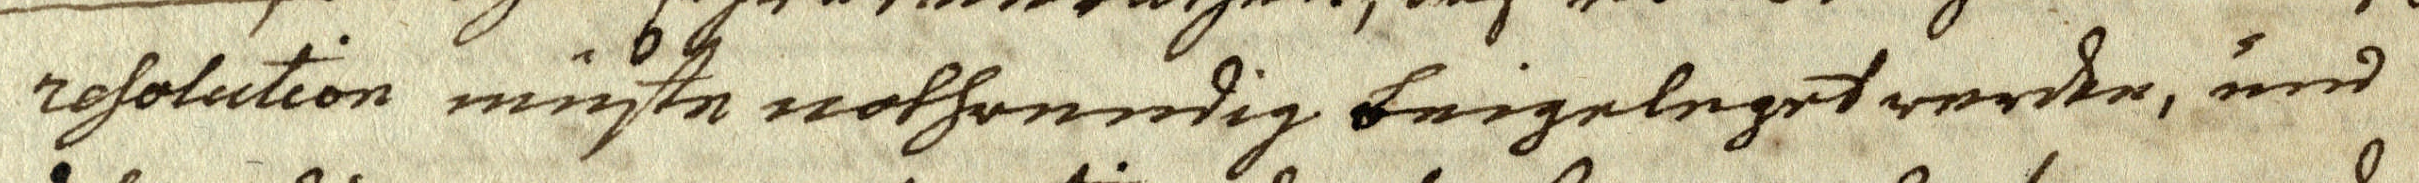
resolution müste nothwendig beigeleget werden, und
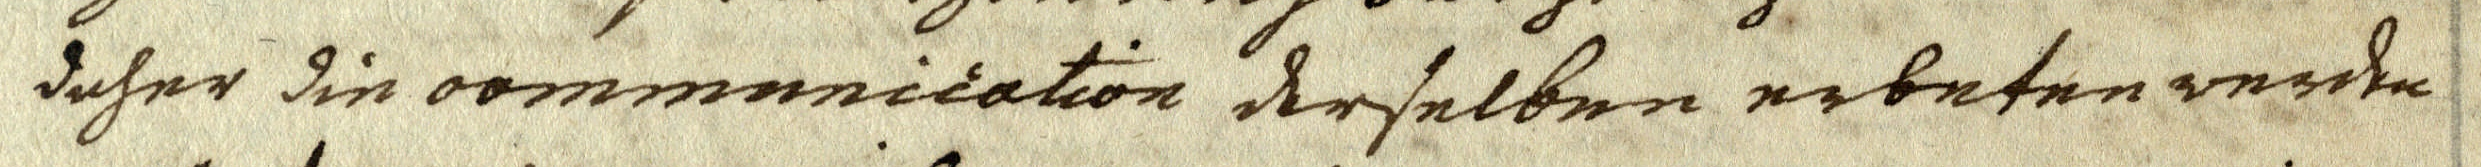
daher die communication derselben erbeten werden
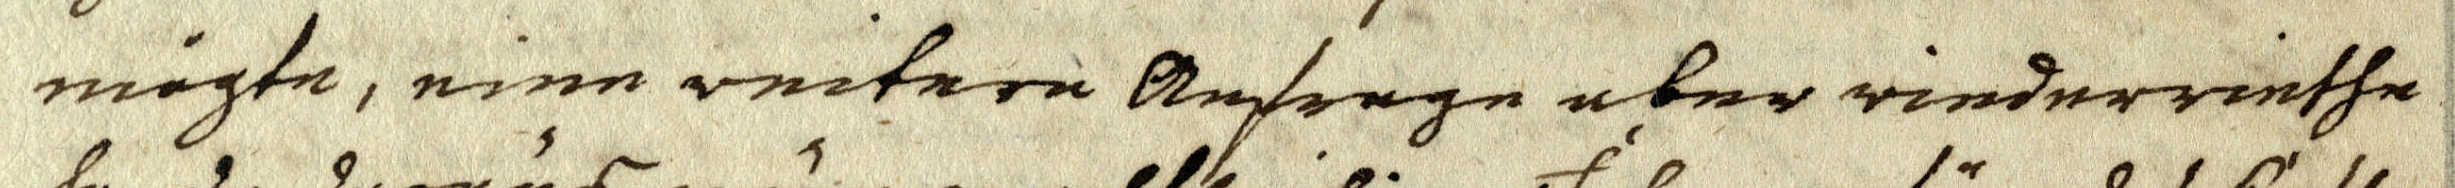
mögte, eine weitere Anfrage aber wiederriethe
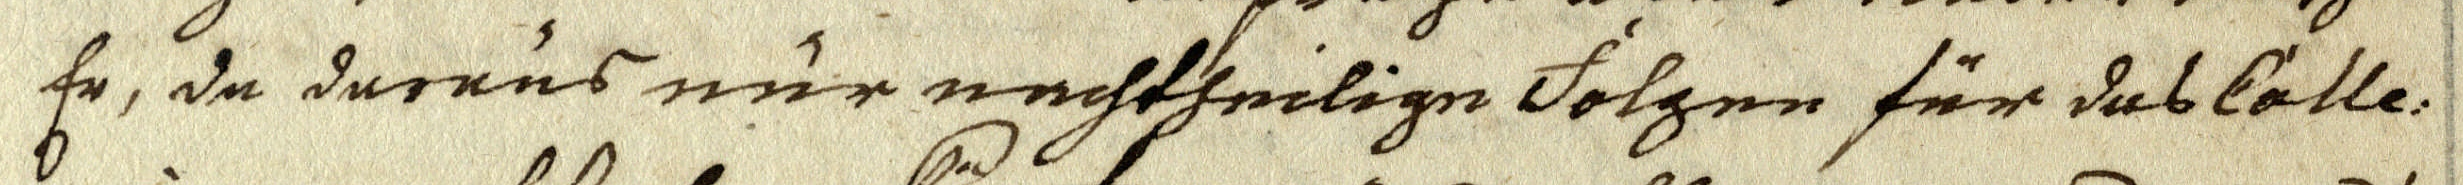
Er, da daraus nur nachtheilige Folgen für das Colle¬
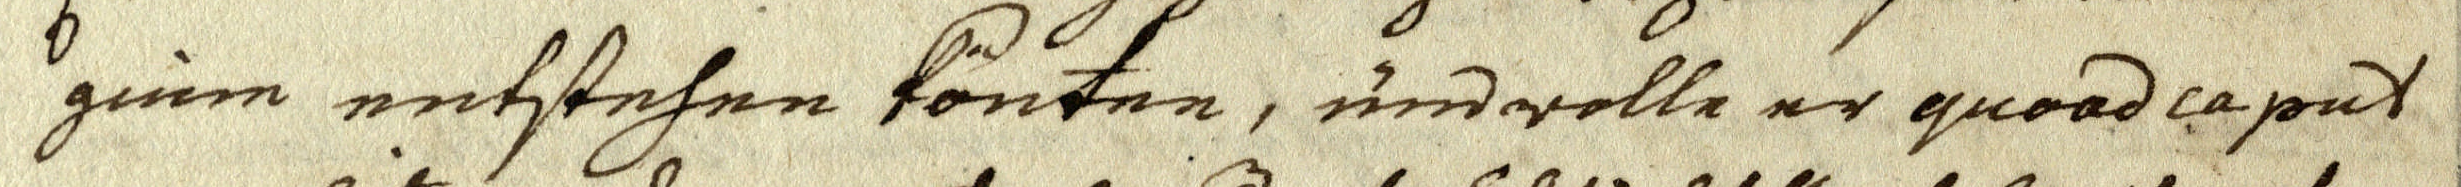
gium entstehen könten, und wolle er quoad caput
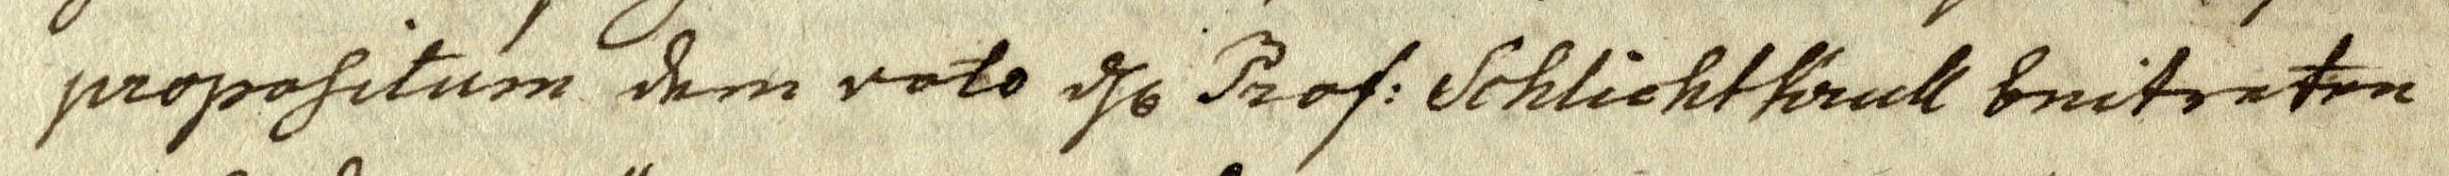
propositum dem voto dh. Prof. Schlichtkrull beitreten.
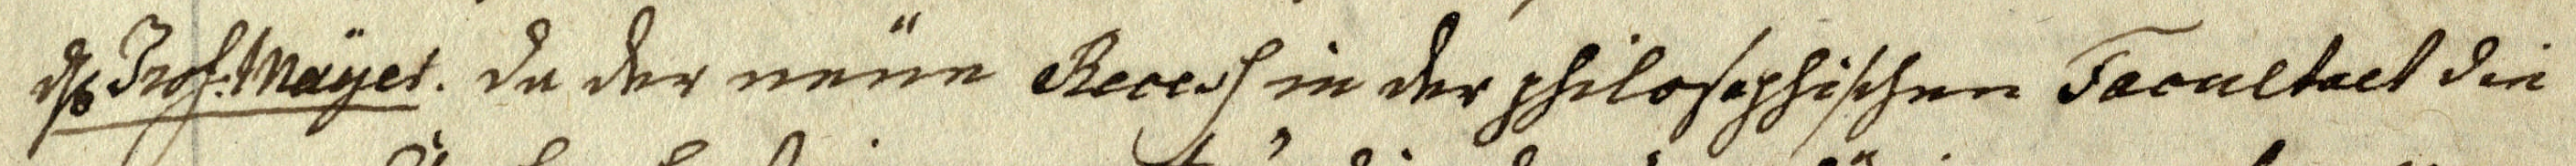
dh. Prof. Maÿer. Da der neue Recess in der philosophischen Facultaet die
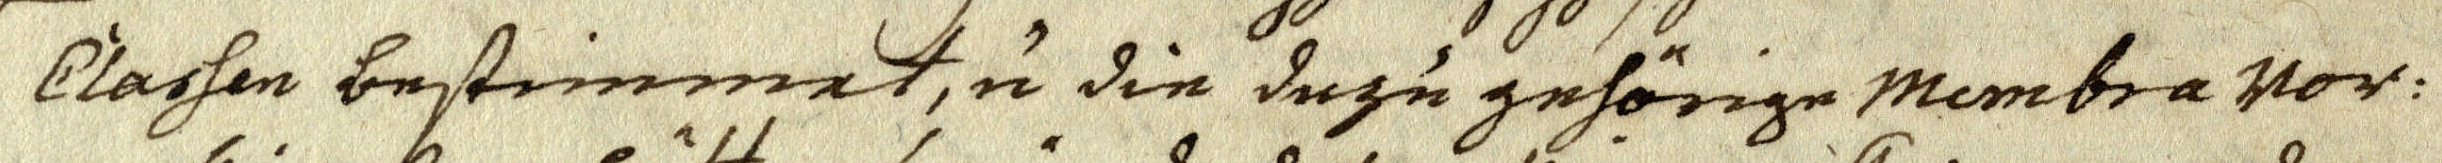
Classen bestimmet, u die dazu gehörige Membra vor¬
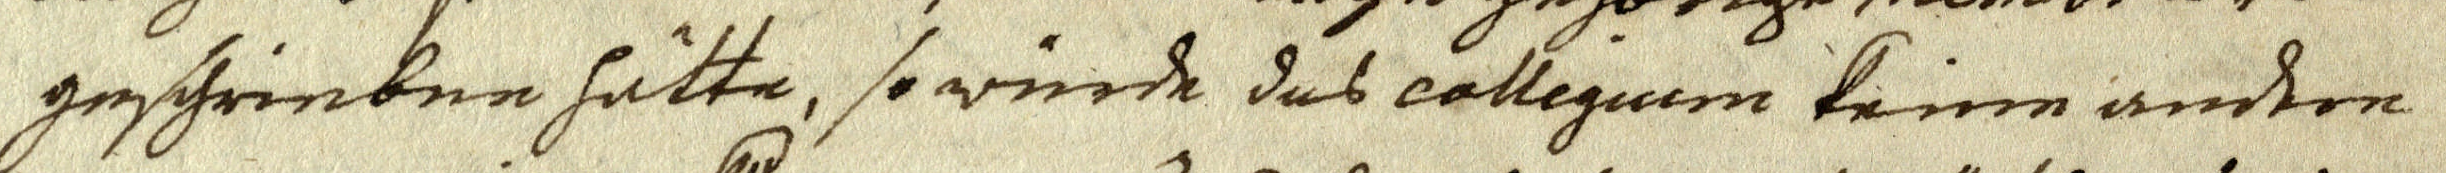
geschrieben hätte, so würde das collegium keinen andern
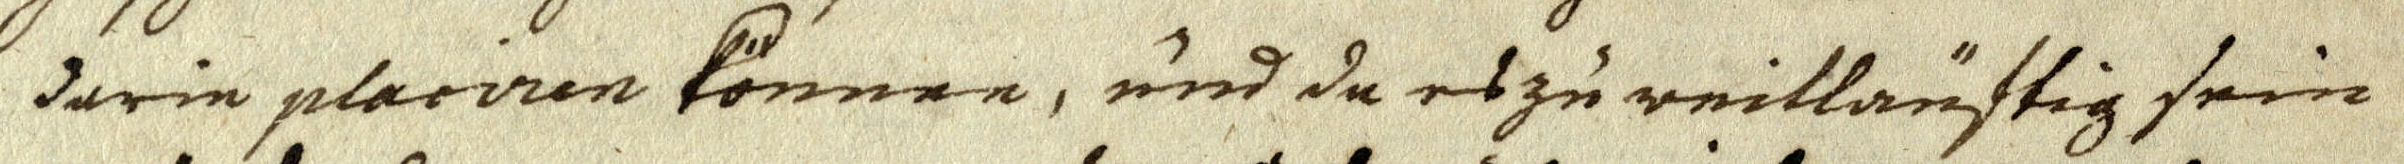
darin placiren können, und da es zu weitläuftig sein
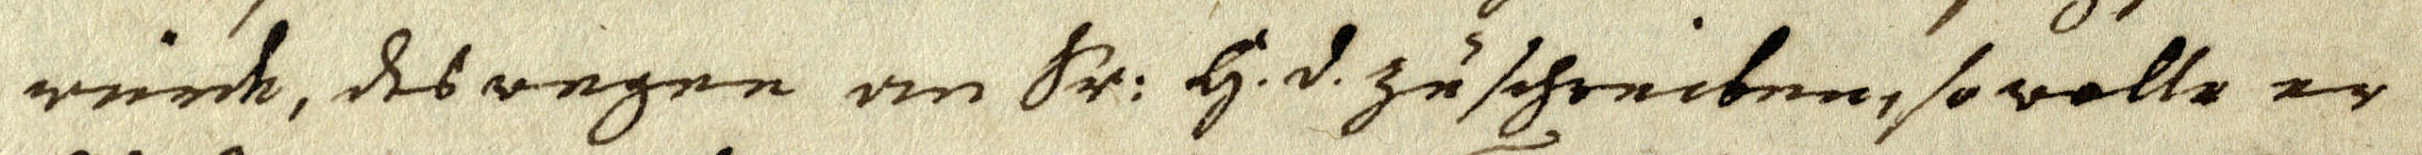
würde, deswegen an seiner H. d. zu schreiben, so wolte er
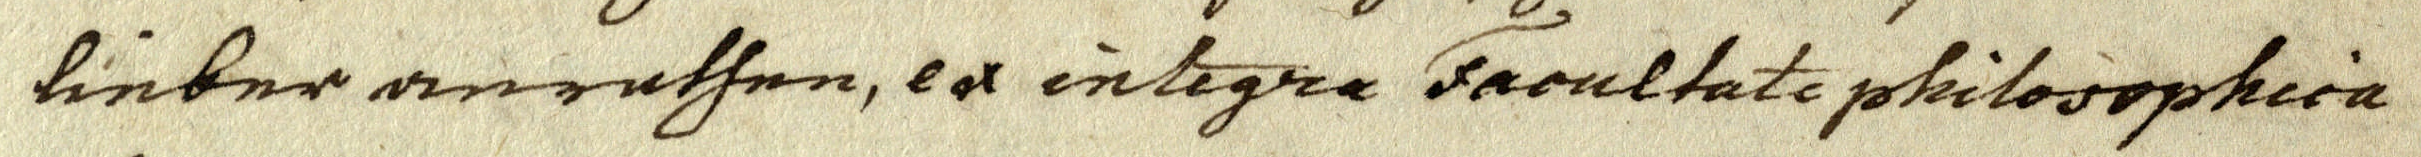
lieber anrathen, ex integra Facultate philosophica
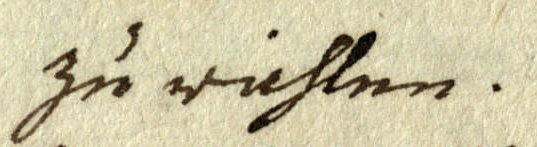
zu wählen.
